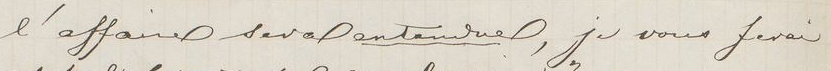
l'affaire sera entendue, je vous ferai
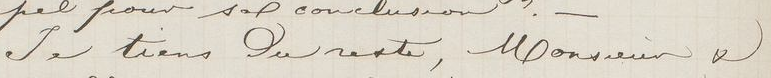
Je tiens du reste, Monsieur &
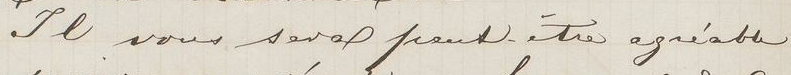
Il vous sera peut-être agréable
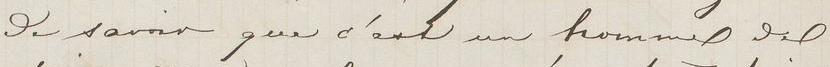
de savoir que c'est un homme de
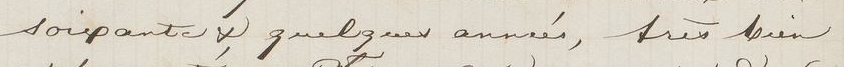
soixante & quelques années, très bien
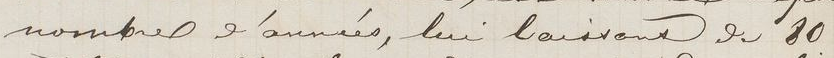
nombre d'années, lui laissant de 80
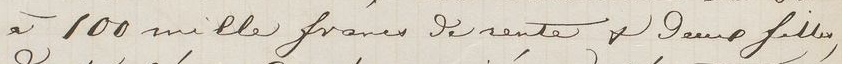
à 100 mille francs de rente & deux filles,
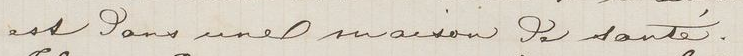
est dans une maison de santé. –
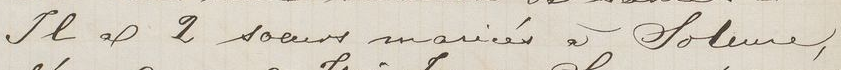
Il a 2 soeurs mariées à Soleure,
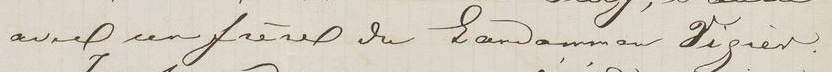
avec un frère du Landamman Vigier.
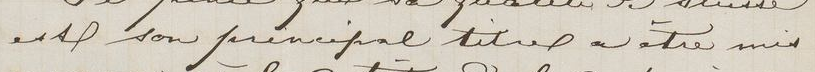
est son principal titre a être mis
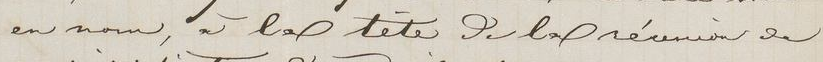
en nom, à la tête de la réunion de
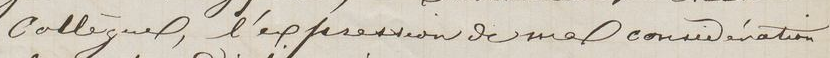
Collègue, l'expression de ma considération
